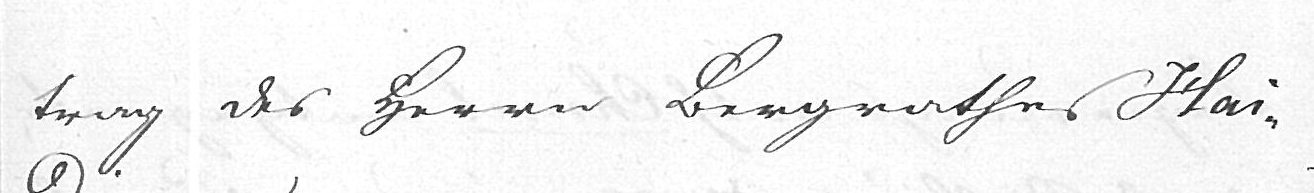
trag des Herrn Bergrathes Hai-
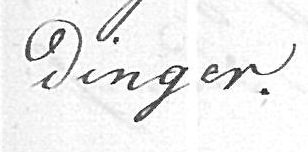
dinger.
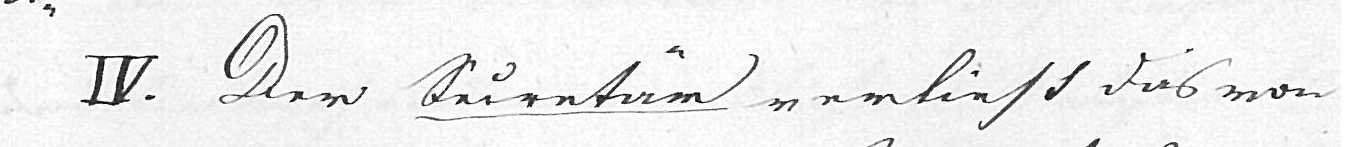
IV. Der Secretär verliest das von
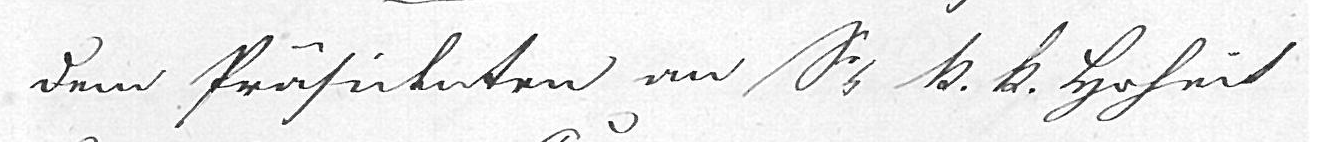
dem Präsidenten an Sr. k. k. Hoheit
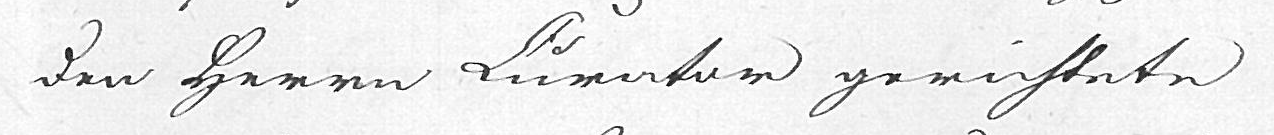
den Herrn Curator gerichtete
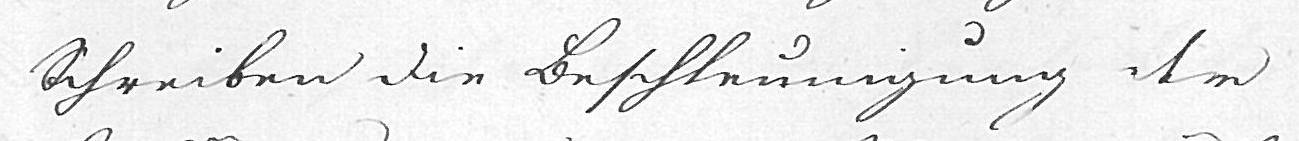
Schreiben die Beschleunigung der
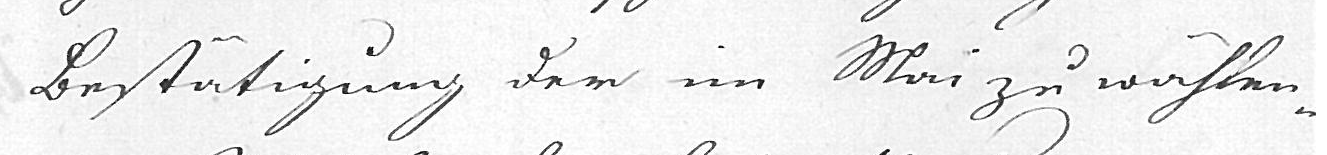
Bestätigung der in Mai zu wählen-
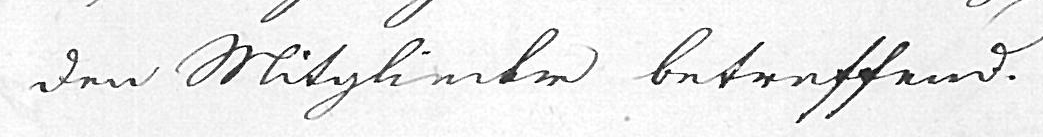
den Mitglieder betreffend.
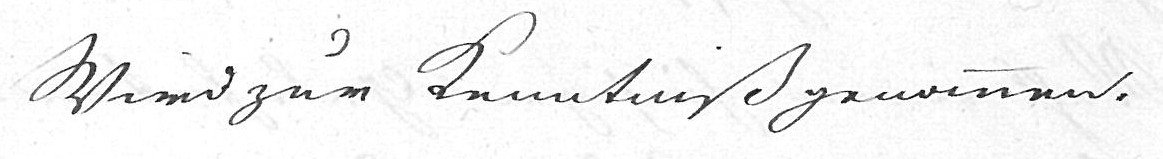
Wird zur Kenntniß genommen.
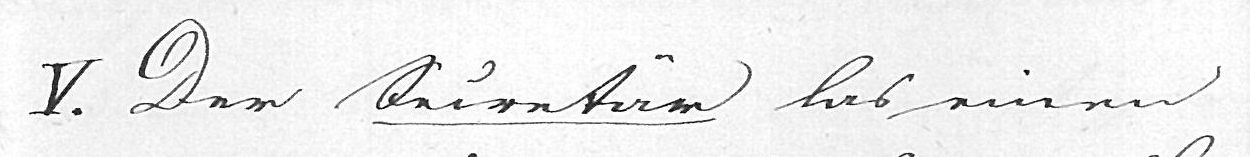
V. Der Secretär las einen
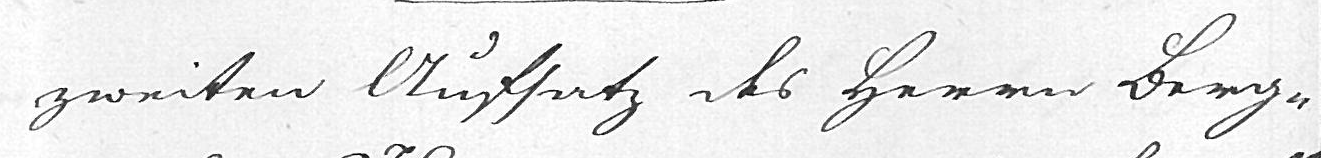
zweiten Aufsatz des Herrn Berg-
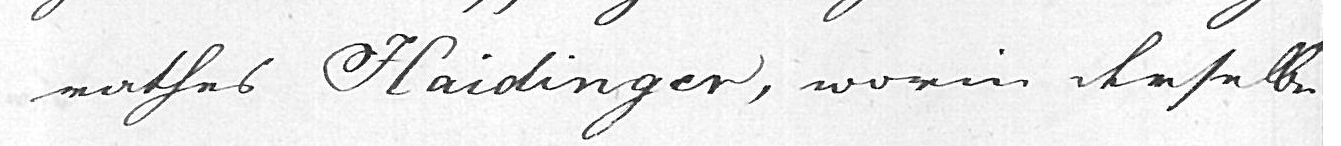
rathes Haidinger, worin derselbe
